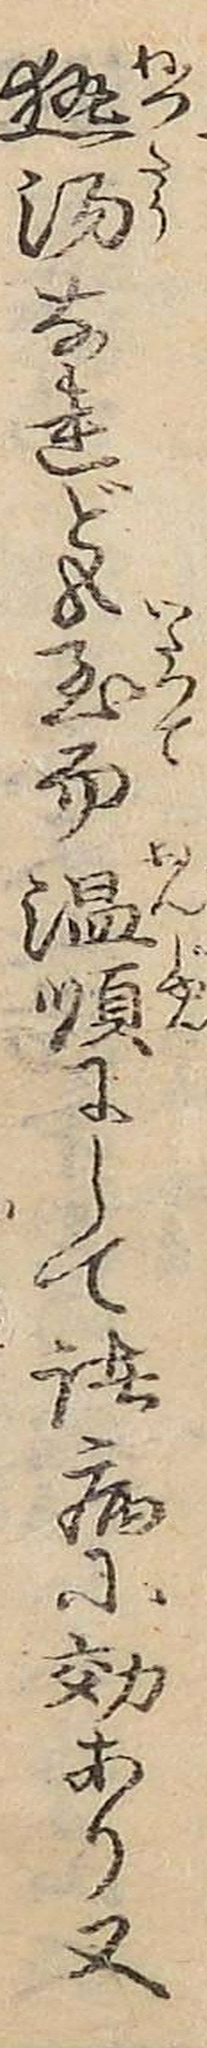熱湯なれども至而温順にして諸病に効あり又
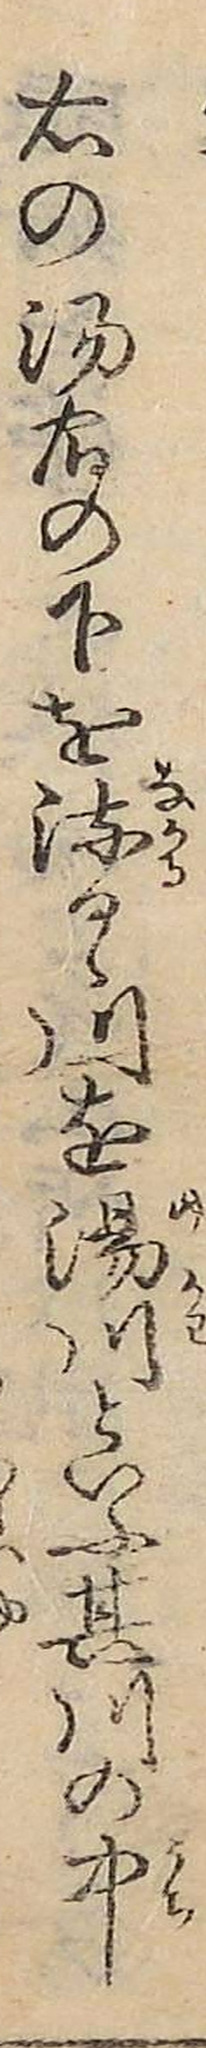右の湯宿の下を流るゝ川を湯川といふ其川の中
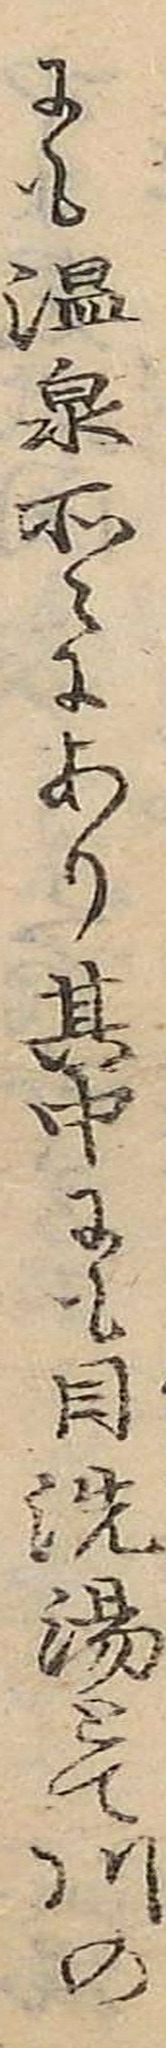にも温泉所々にあり其中にも目洗湯とて川の

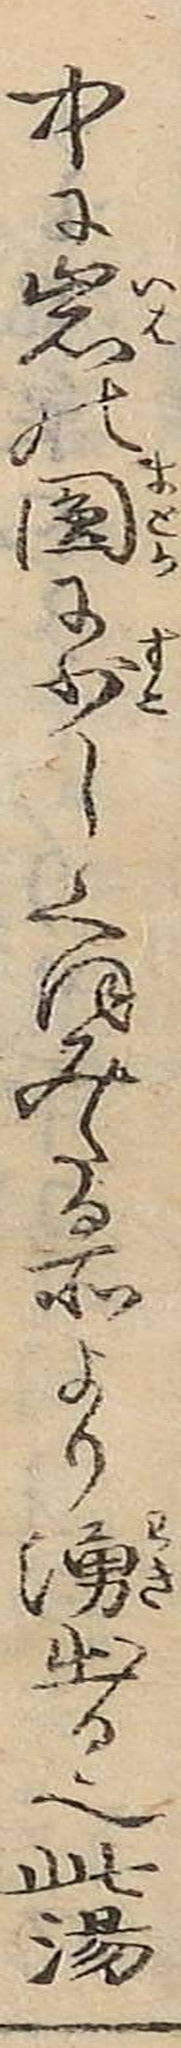中に岩の円に少しくほみたる所より湧出る也此湯
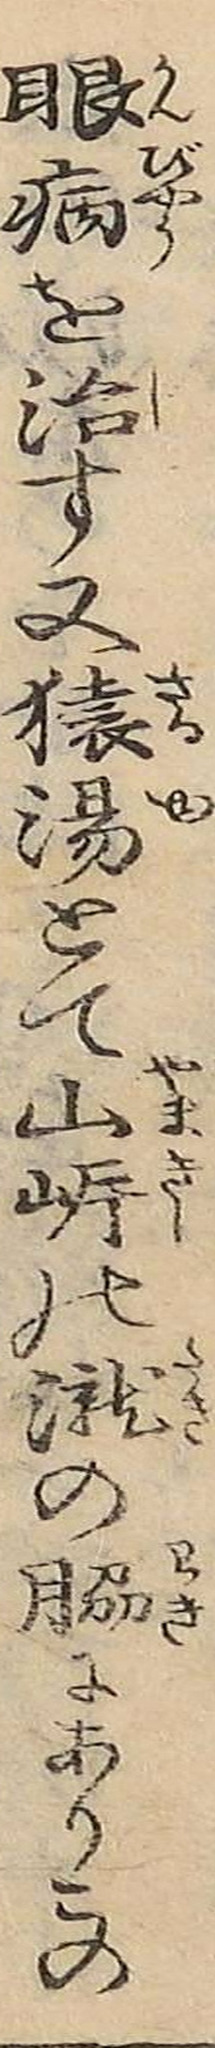眼病を治す又猿湯とて山岸の滝の脇にありこの
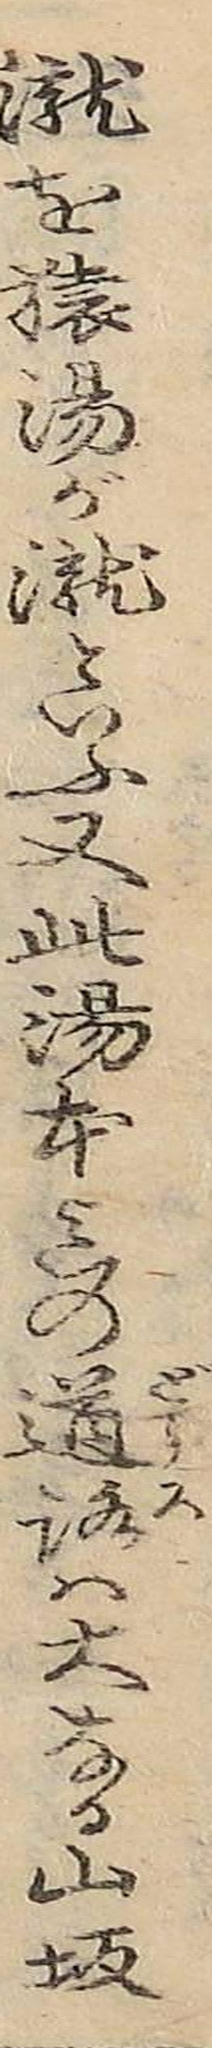滝を猿湯が滝といふ又此湯本迄の道路は大なる山坂
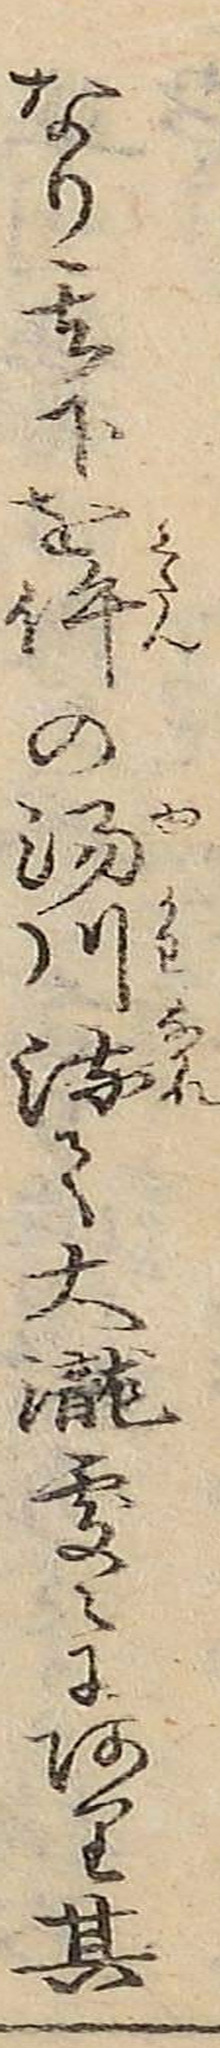なり其下を件の湯川流て大滝処々にあり其
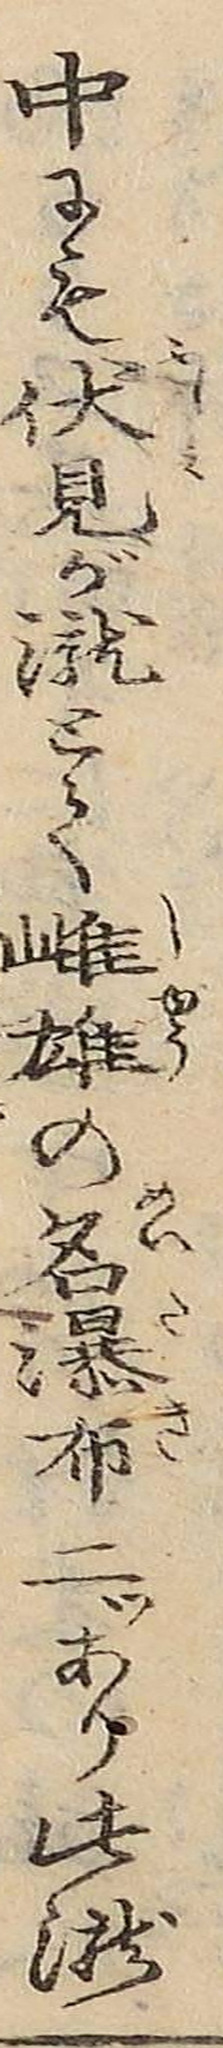中にも伏見が滝とて雌雄の名瀑布二此滝
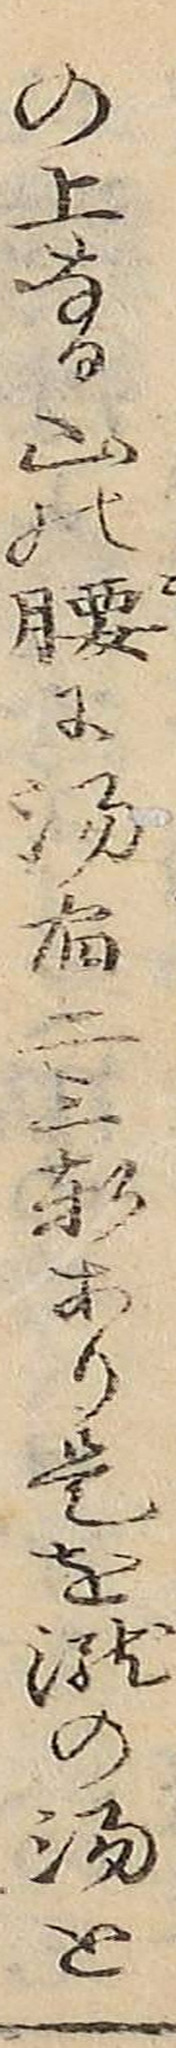の上なる山の腰に湯宿二三軒あり是を滝の湯と
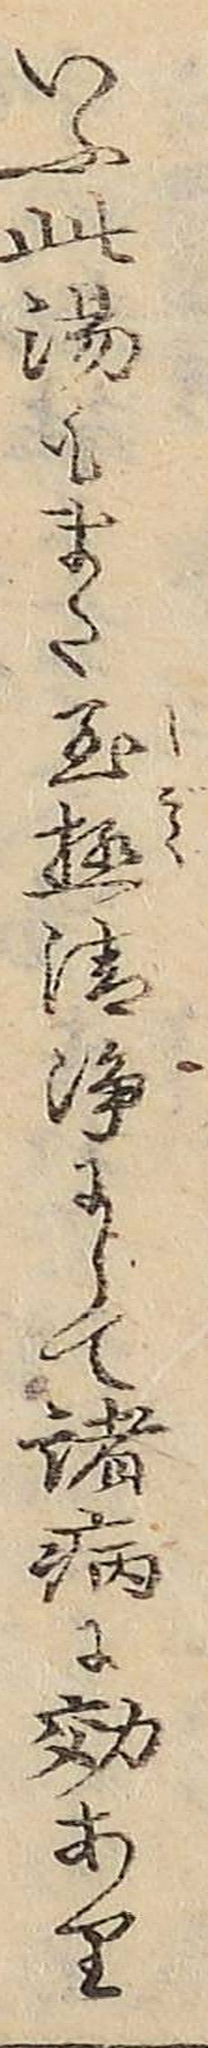いふ此湯もまた至極清浄にして諸病に効あり
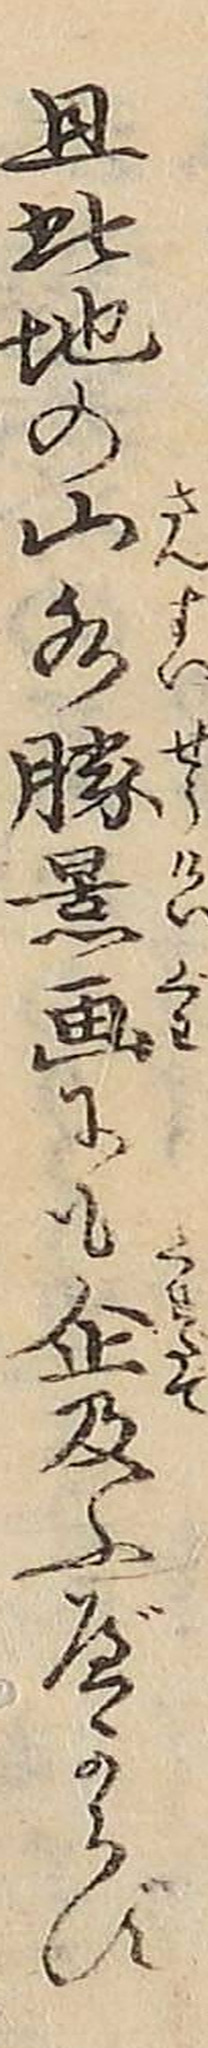且此地の山水勝景画にも企及ふべからず
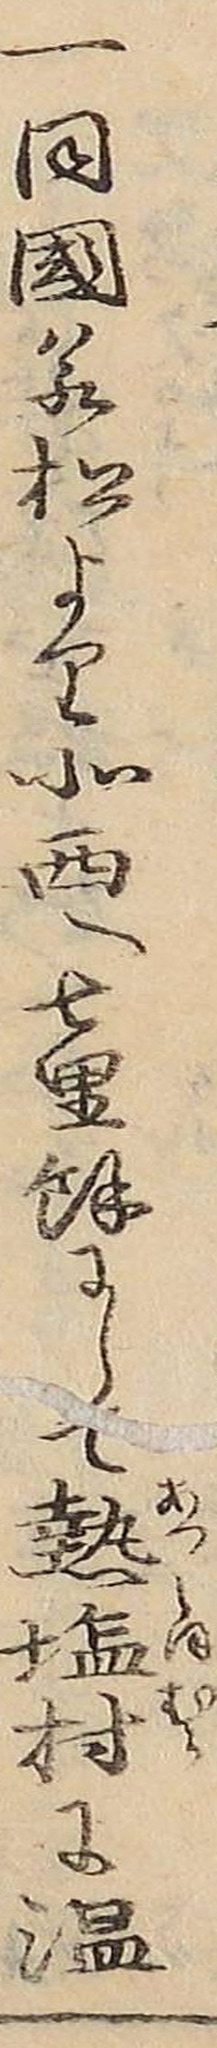一同国若松より北西へ七里余にして熱塩村に温
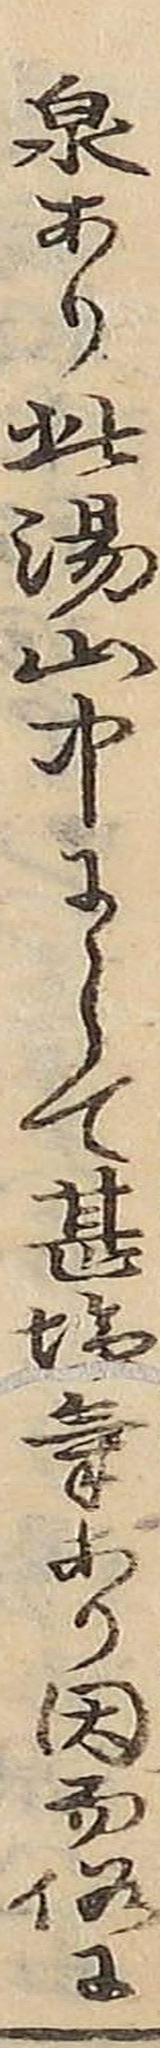泉あり此湯山中にして甚塩気あり因而俗に
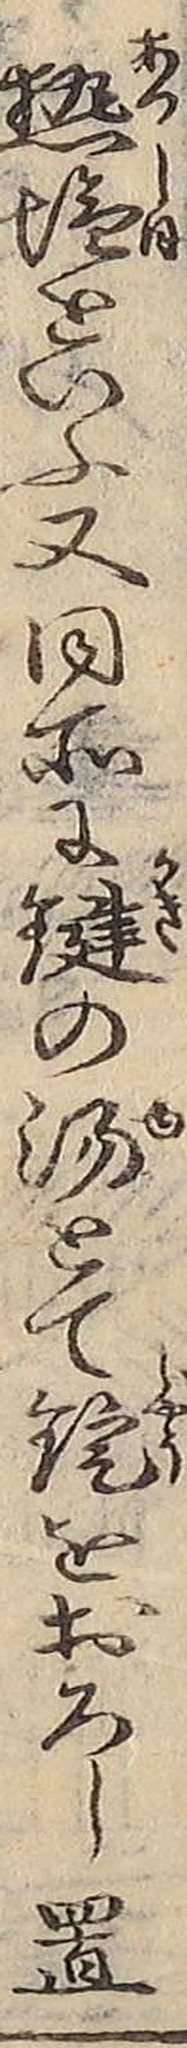熱塩といふ又同所に鍵の湯とて錠をおろし置
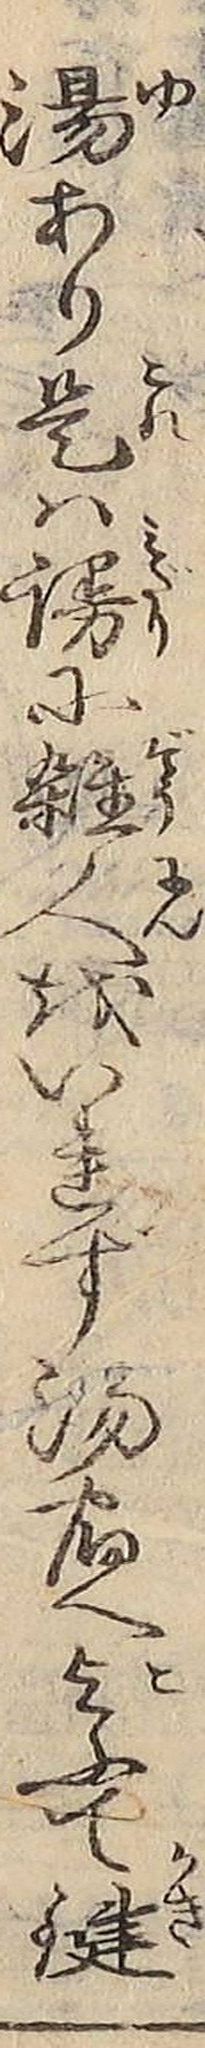湯あり是は漫に雑人をいれず湯宿へ乞ふて鍵
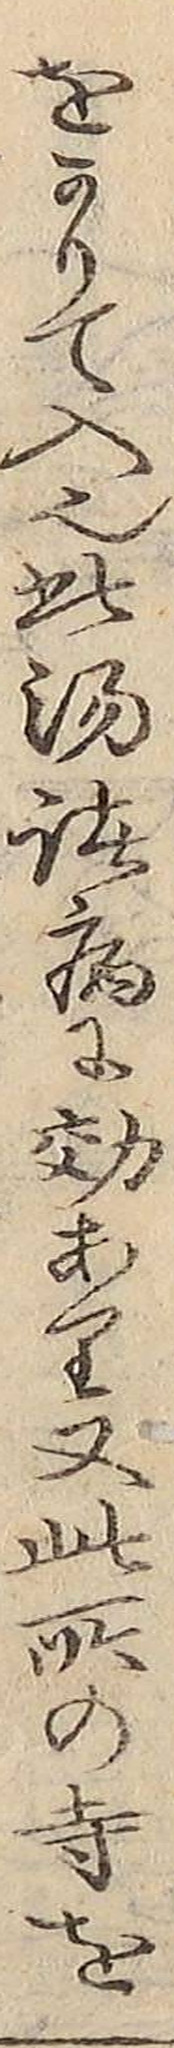をかりて入也此湯諸病に効あり又此所の寺を
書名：旅行用心集
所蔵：神戸大学附属図書館 国文学研究資料館
